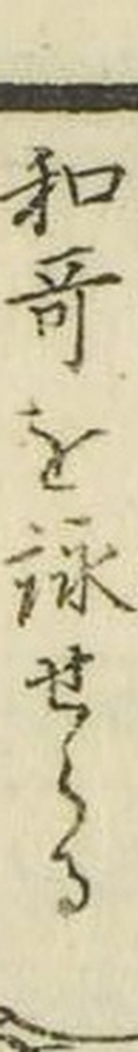和哥を詠せらる
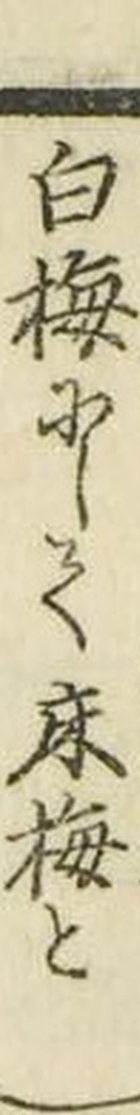白梅にして床梅と
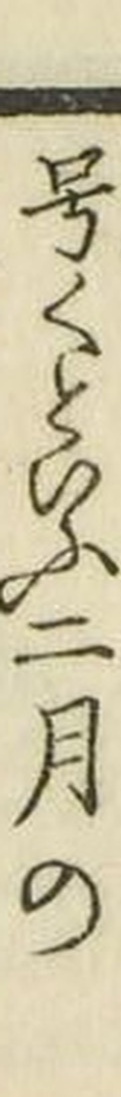号くといふ二月の
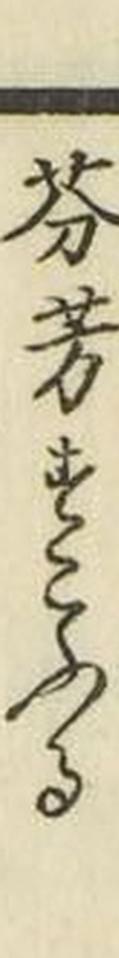芬芳すこふる
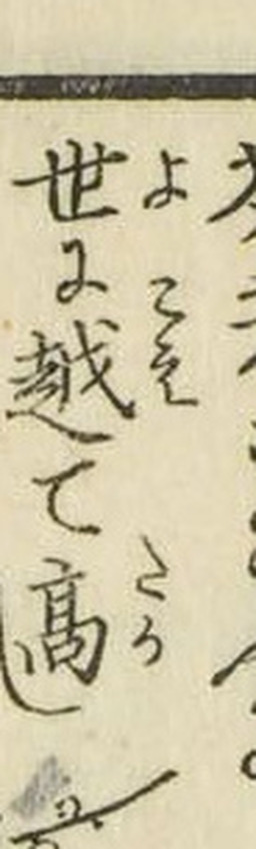世に越て髙し

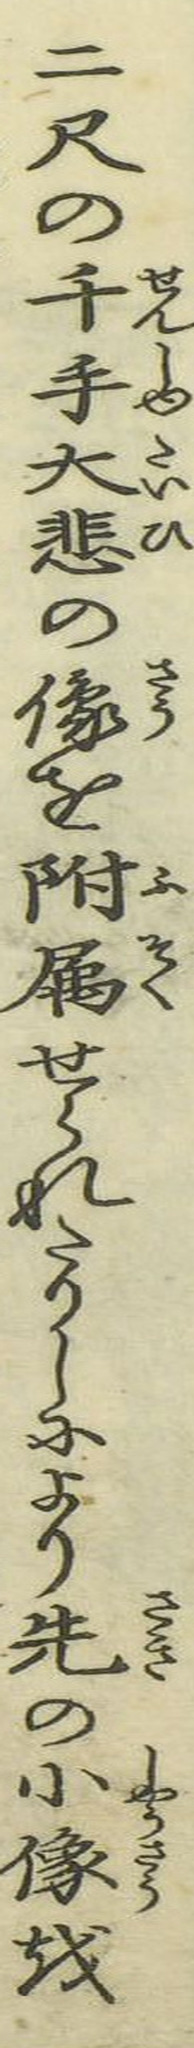二尺の千手大悲の像を附属せられたりしにより先の小像を
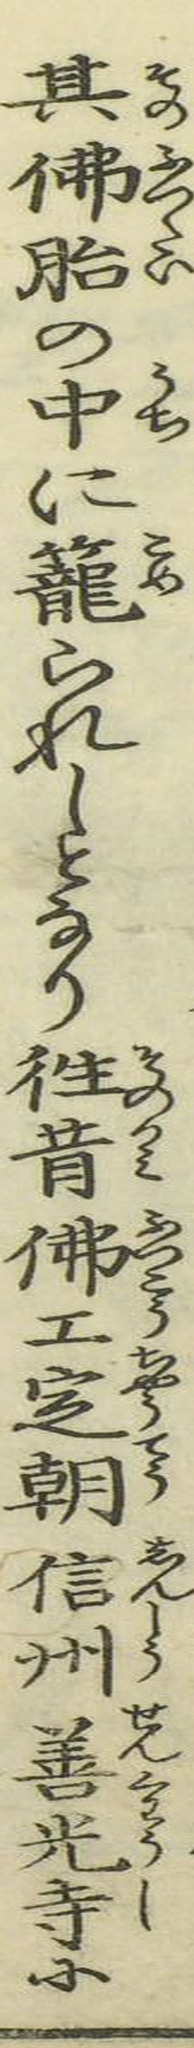其佛胎の中に籠られしとなり往昔佛工定朝信州善光寺に
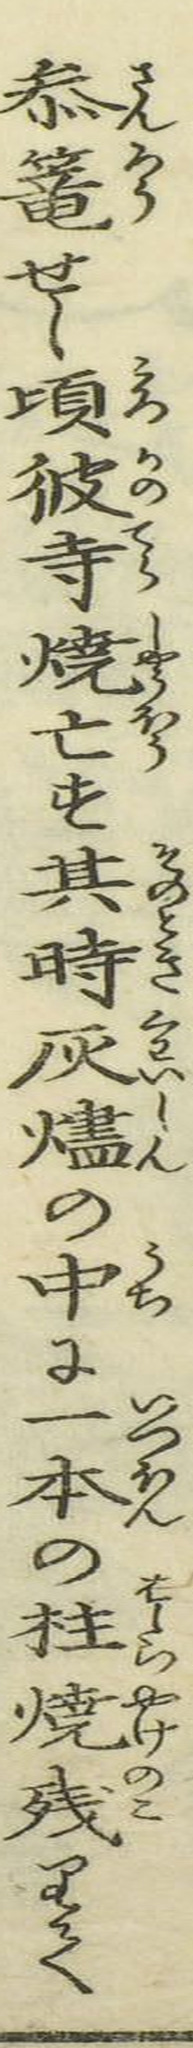参篭せし頃彼寺焼亡す其時灰燼の中に一本の柱焼残りて
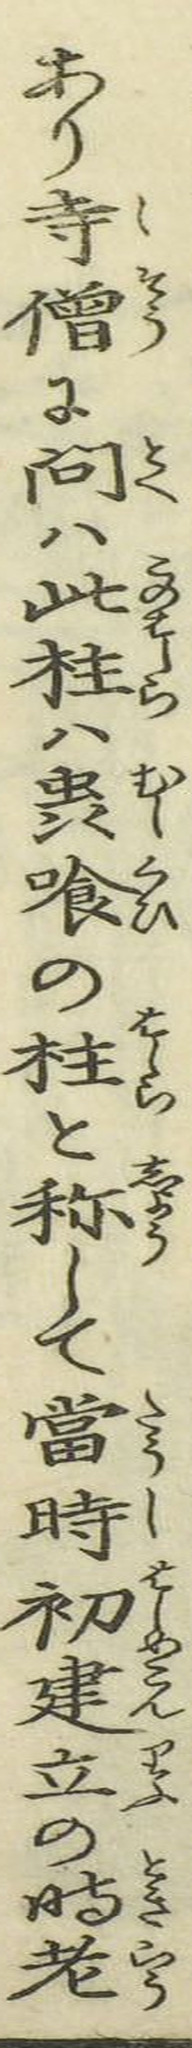あり寺僧に問は此柱は蟲喰の柱と称して當時初建立の時老
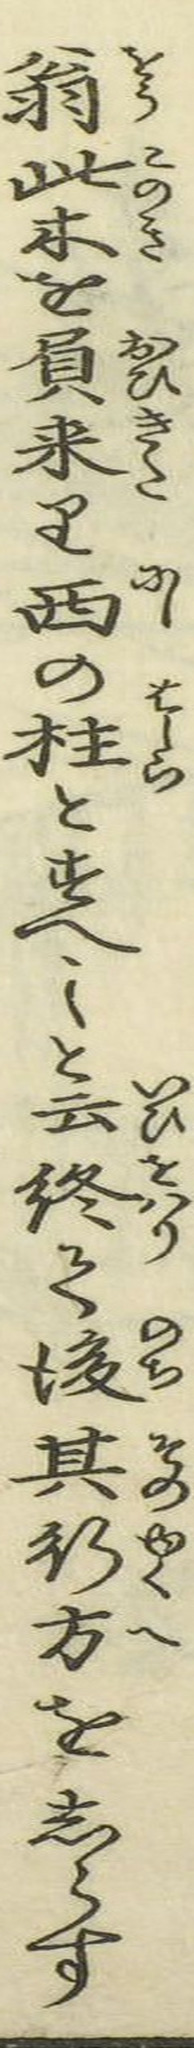翁此木を負来り西の柱とすへしと云終て後其行方をしらす
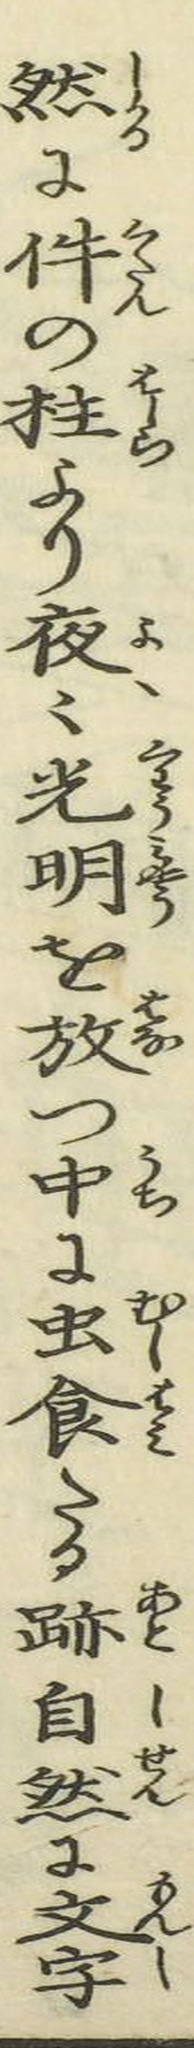然に件の柱より夜々光明を放つ中に虫食たる跡自然に文字
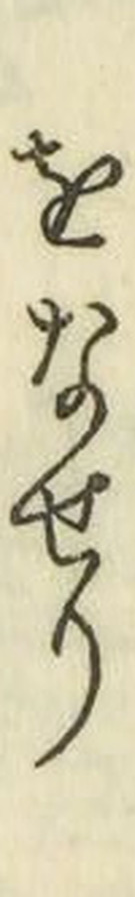をなせり
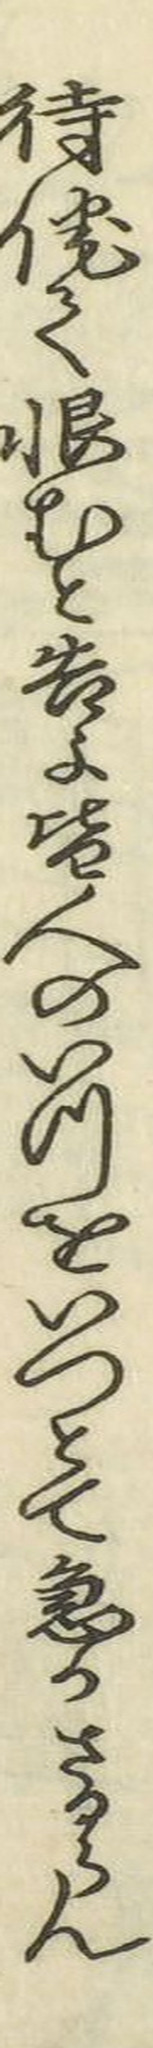待侘て恨むと告よ皆人のいつをいつとて急かさるらん
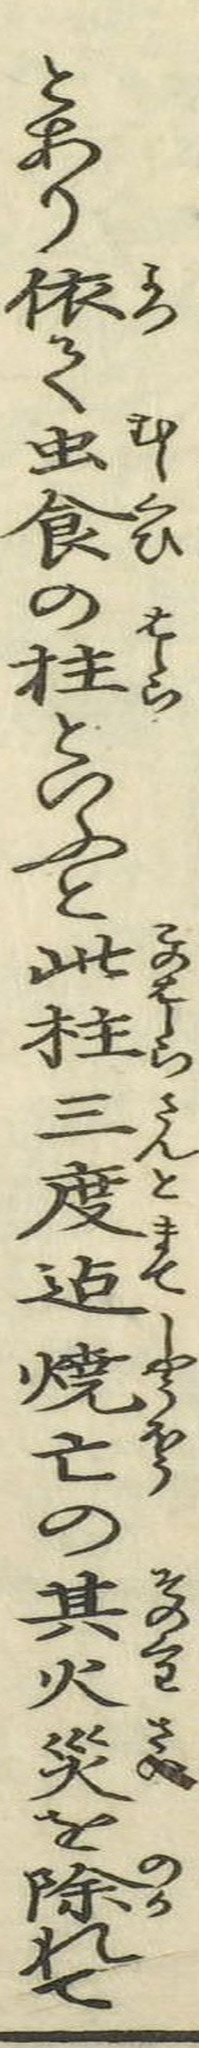とあり依て虫喰の柱といふと此柱三度迠焼亡の其火災を除れて
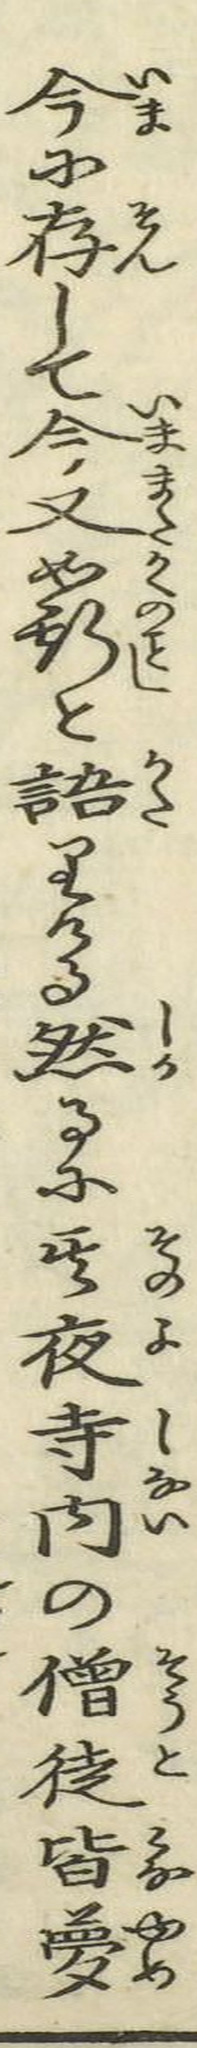今に存して今又如斯と語りける然るに其夜寺内の僧徒皆夢
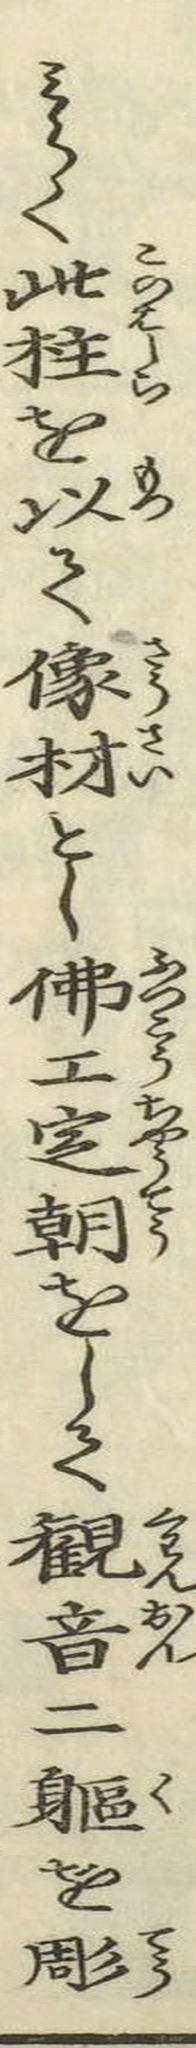みらく此柱を以て像材とし佛工定朝をして観音二軀を彫
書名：江戸名所図会 20巻 巻之7
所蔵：東京学芸大学教育コンテンツアーカイブ
